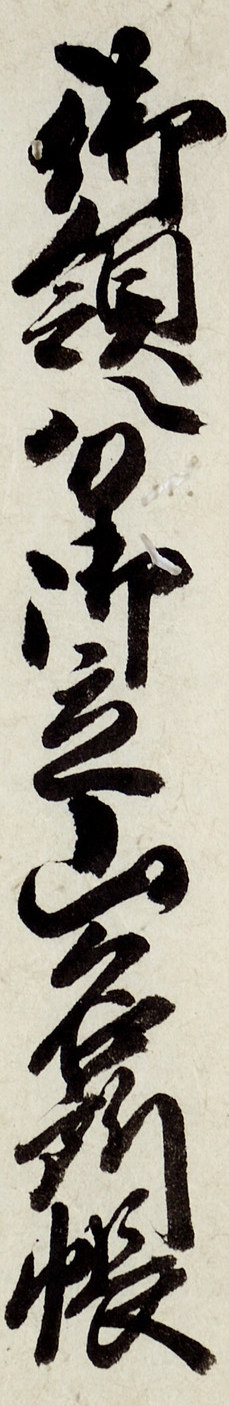御領分御立山名所帳

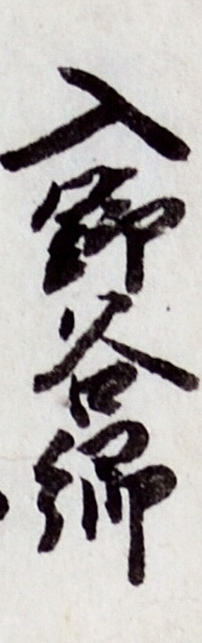入野谷郷
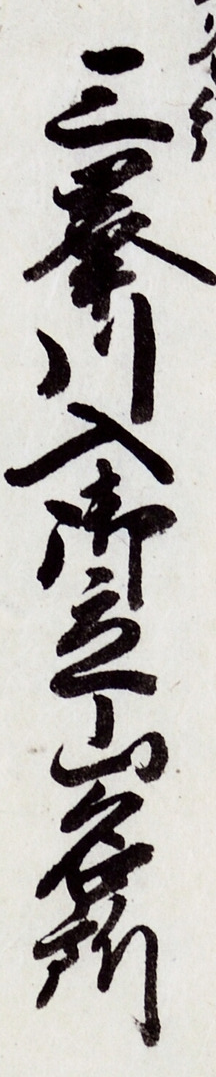三峯川入御立山名所
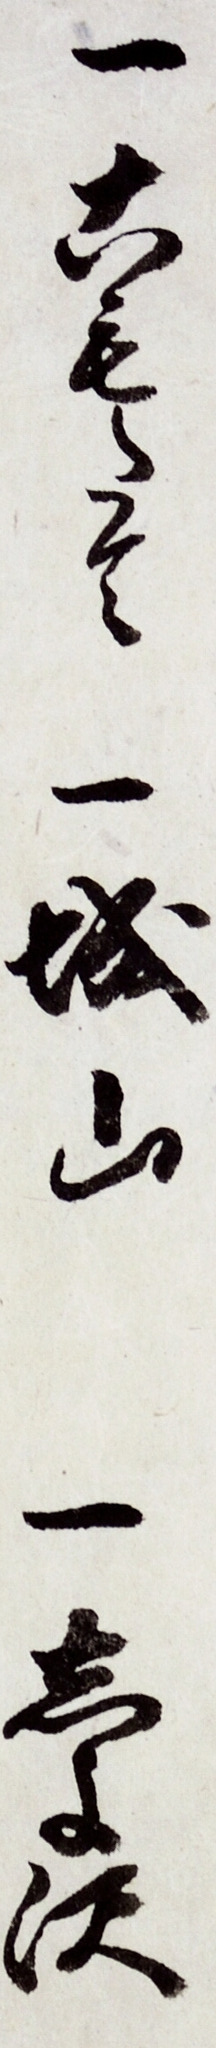一こもたて一城山一しよ沢
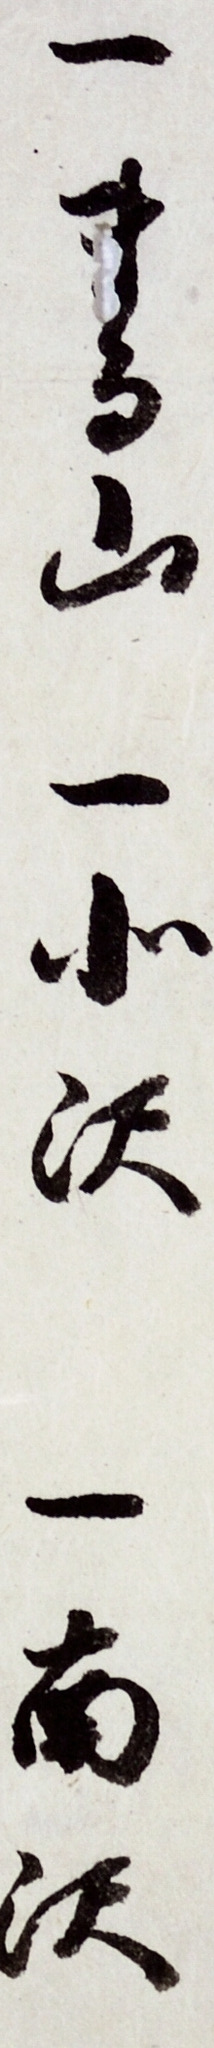一まる山一北沢一南沢
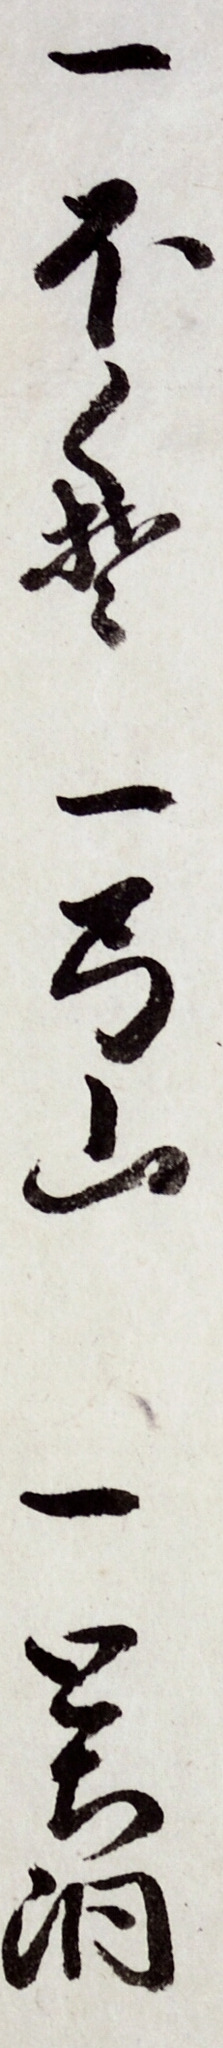一ふくそ一弓山一とち洞
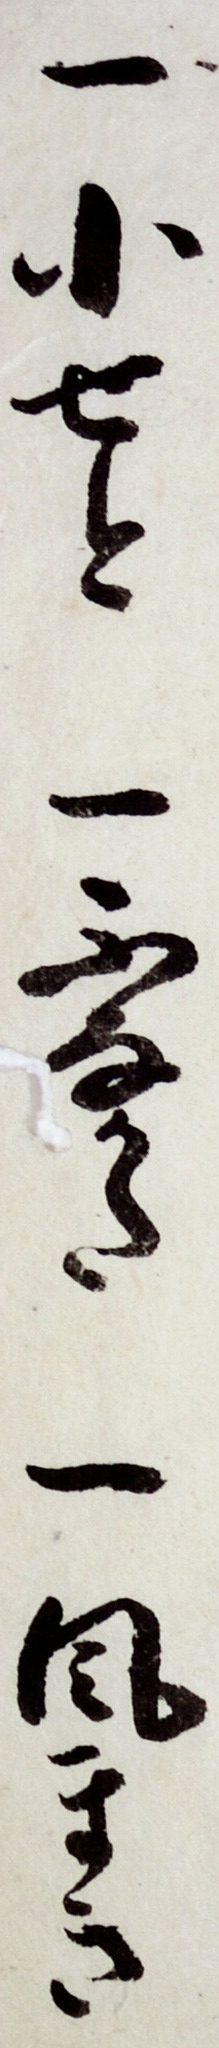一小せと一ふなかた一風まき

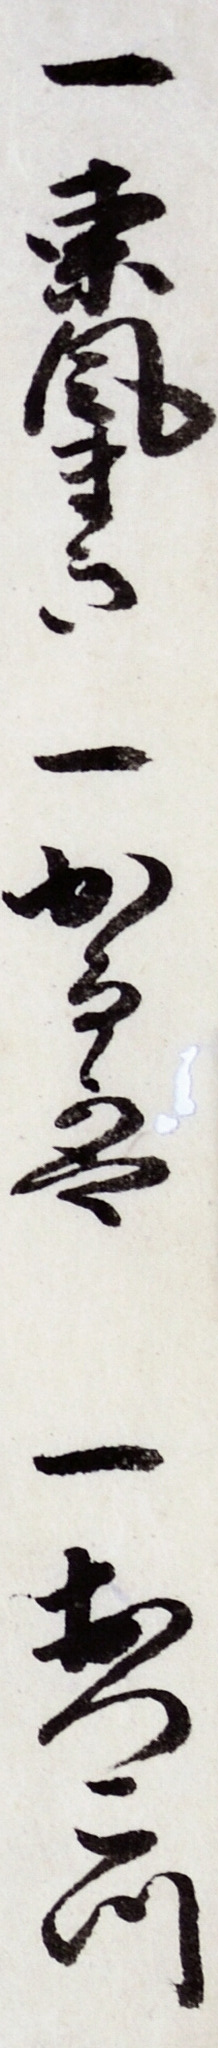一東風まき一かるかや一おつこつ
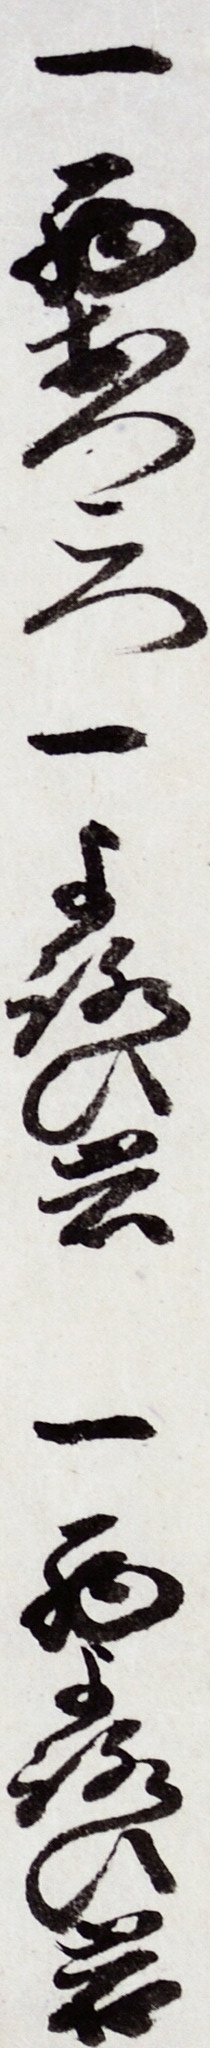一西おつこつ一よろひ岩一西よろひ岩
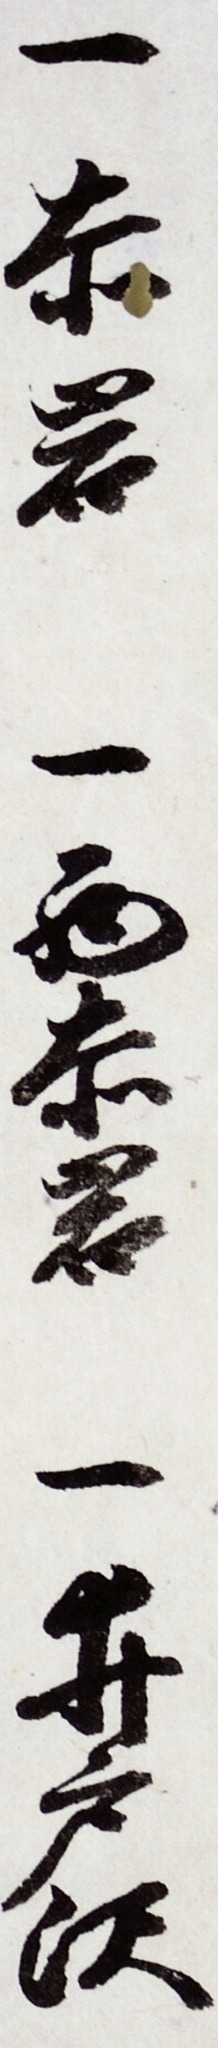一赤岩一西赤岩一井戸沢
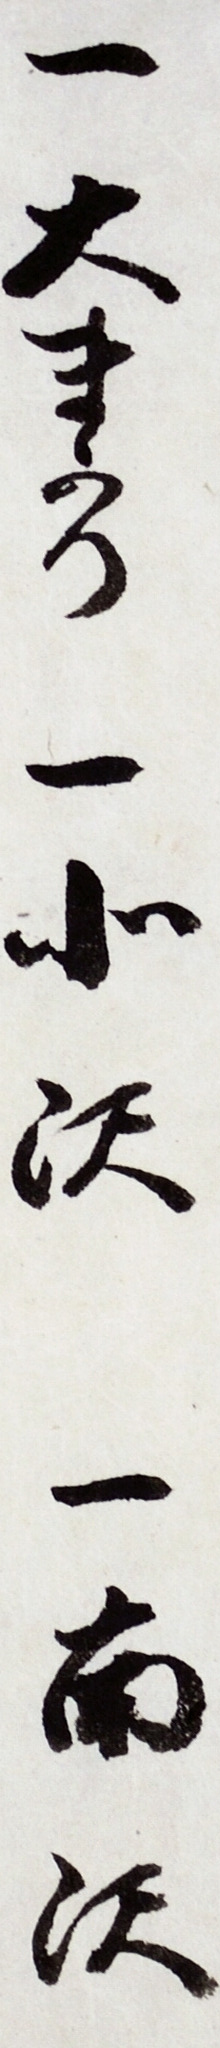一大まかり一北沢一南沢
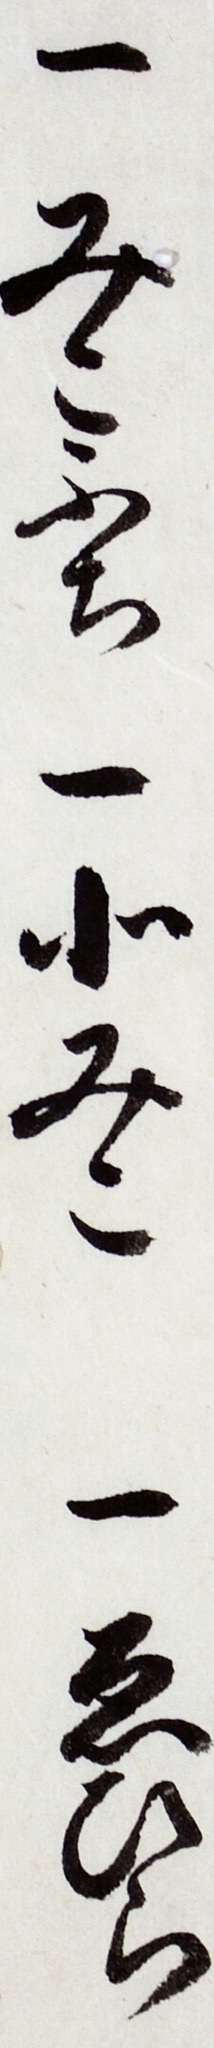一みこふち一北みこ一ゑひら
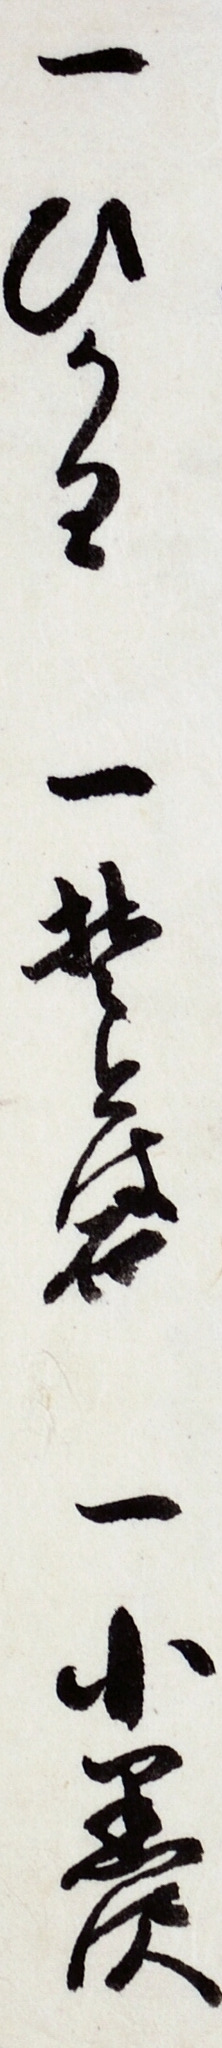一ひかわ一そとは石一小黒沢
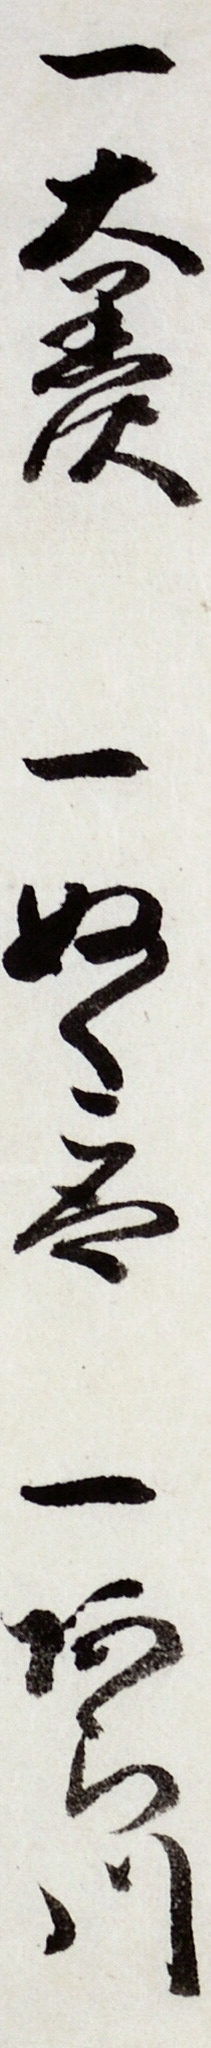一大黒沢一ぬくこや一あら川
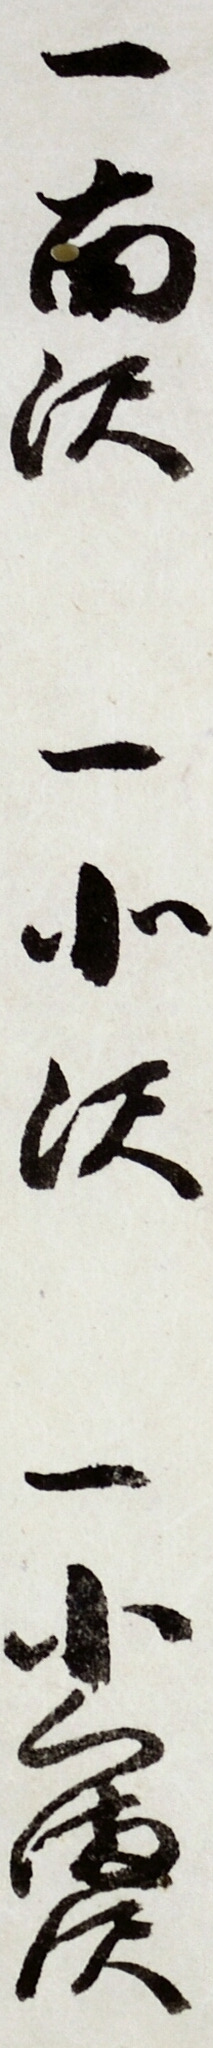一南沢一北沢一小くま沢
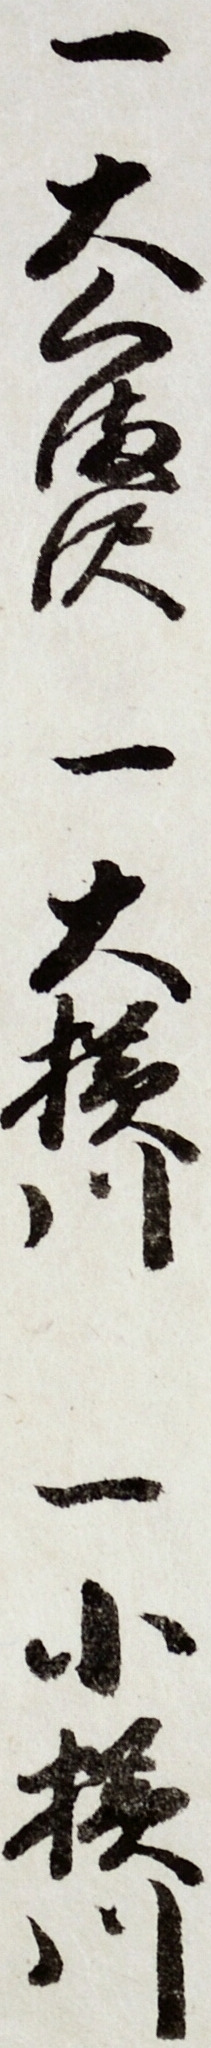一大くま沢一大横川一小横川
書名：御領分御立山名所帳
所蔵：伊那市立高遠町図書館・合同会社AMANE
